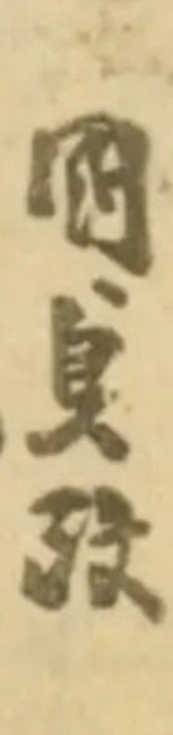国貞改
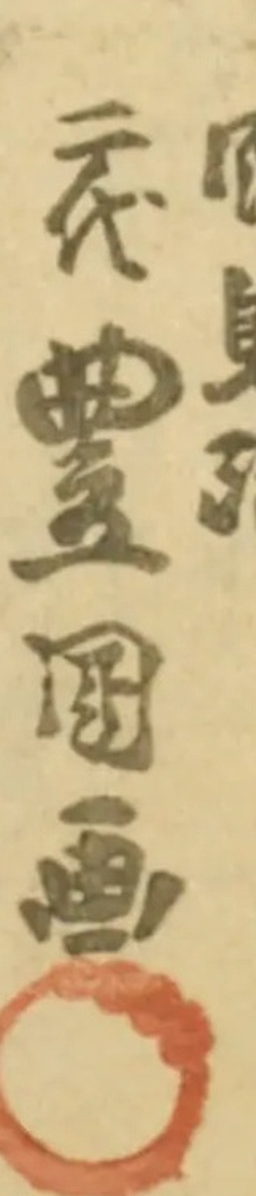二代豊国画
